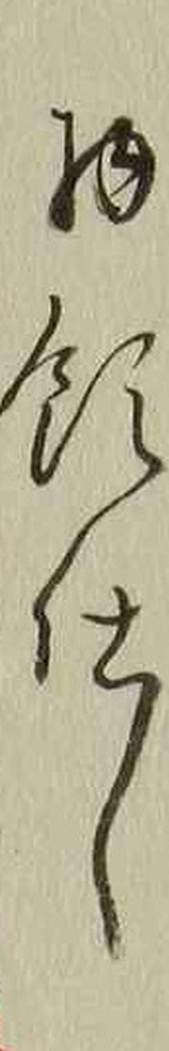拝領仕候
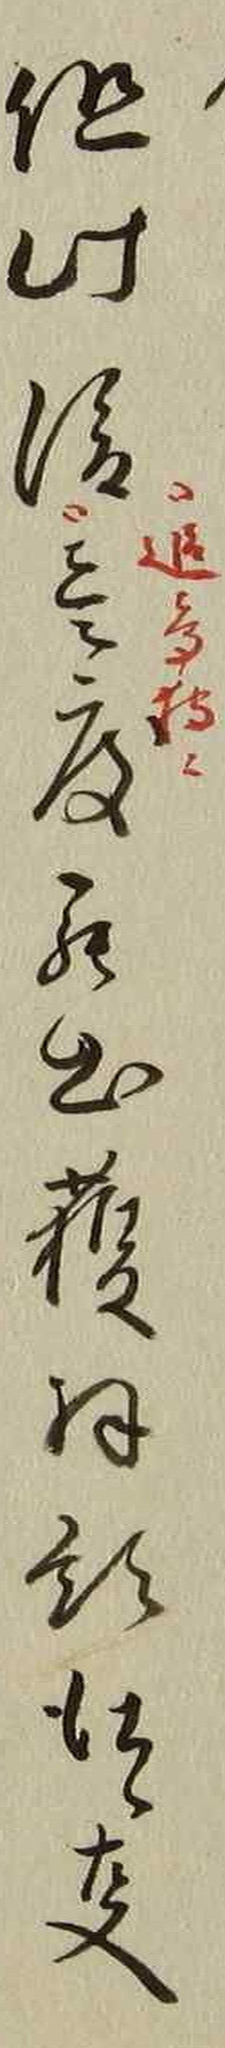但此後◦壱度罷出獲拝領仕候事
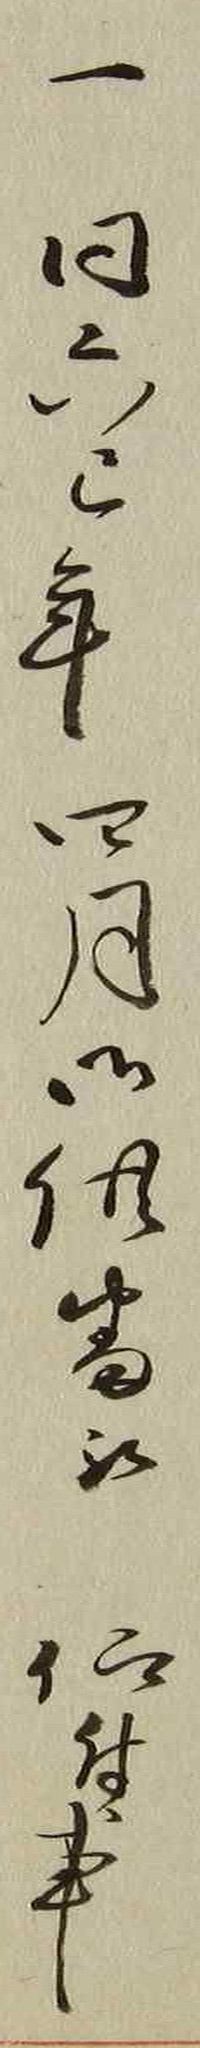一同六巳年四月御供番被仰付候事
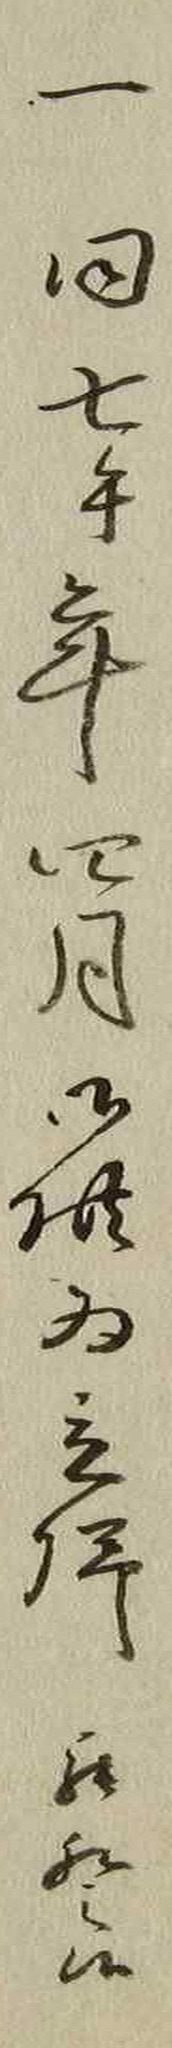一同七午年四月御供為立帰罷登候
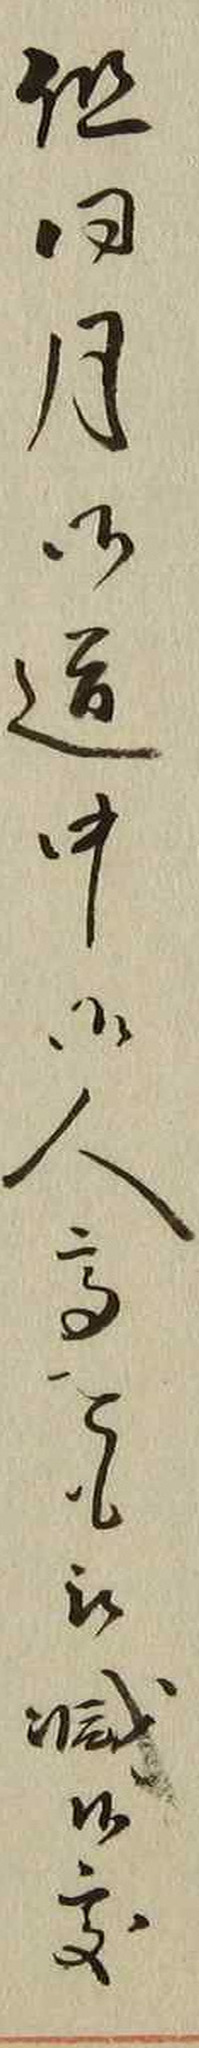但同月御道中御人高をも被減候処
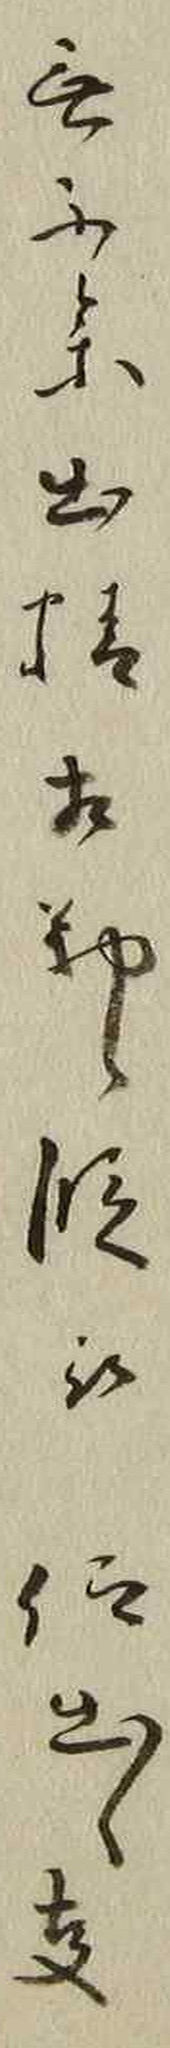無不参出精相勤候段被仰出候事
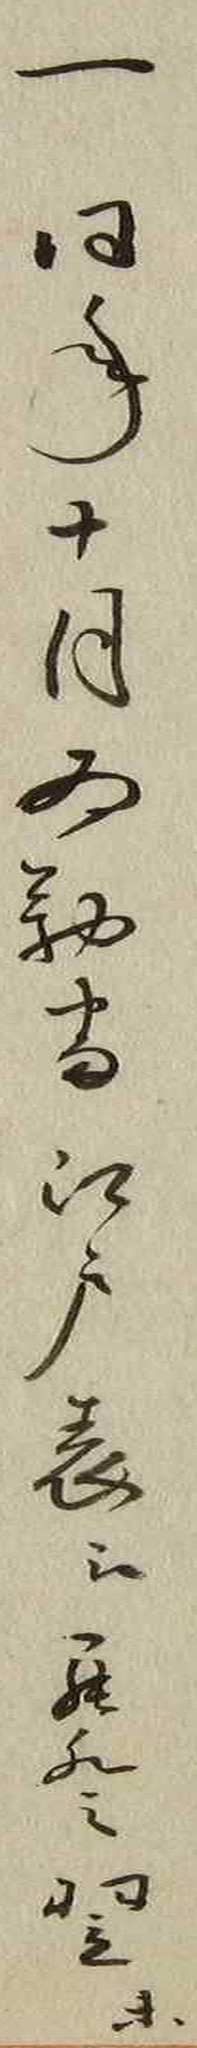一同年十月為勤番江戸表江罷登翌未
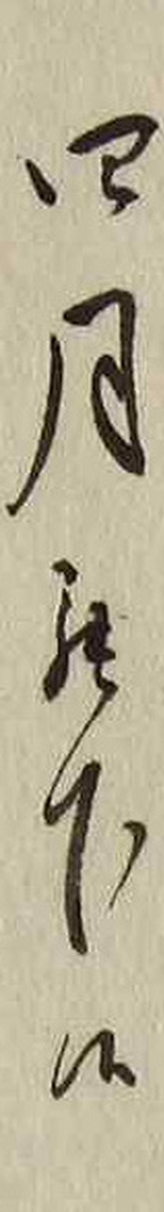四月罷下候
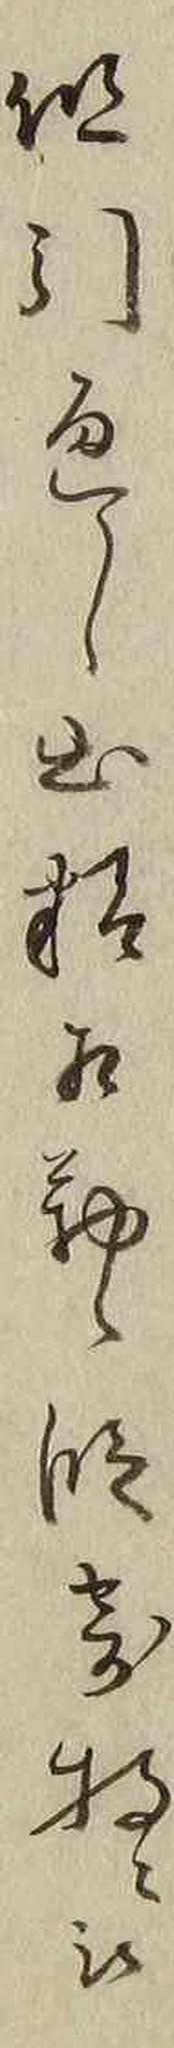但引通之出精相勤候段奇特に被
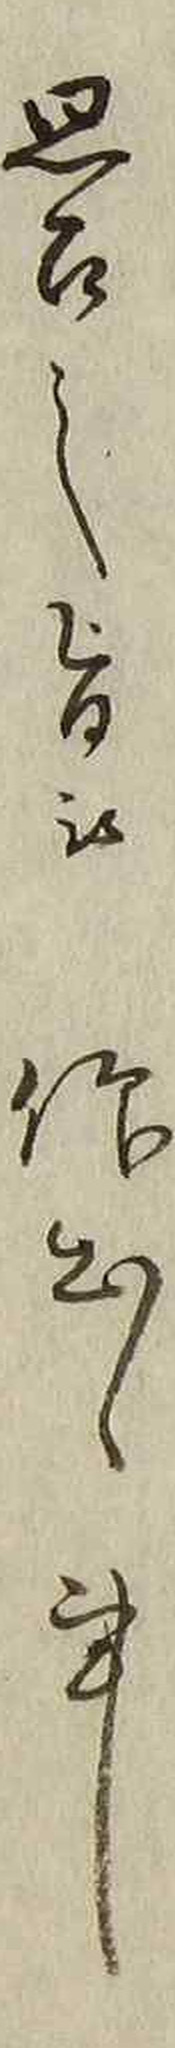思召之旨被仰出候事
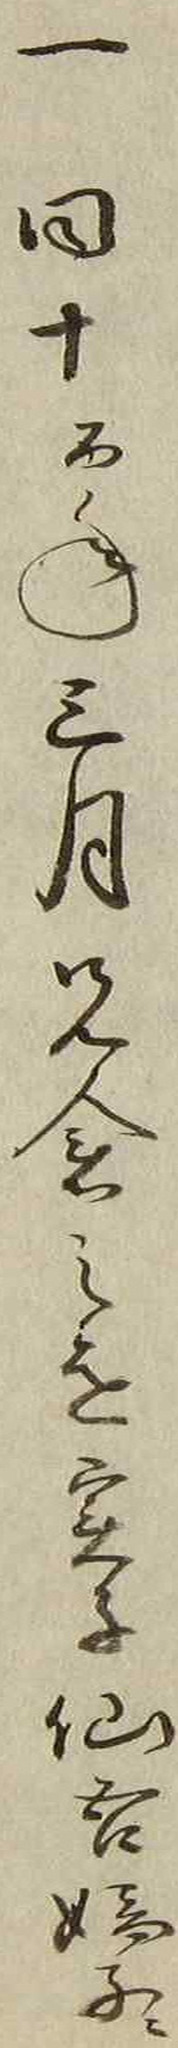一同十酉年三月兄倉之進実子仙吾嫡子に
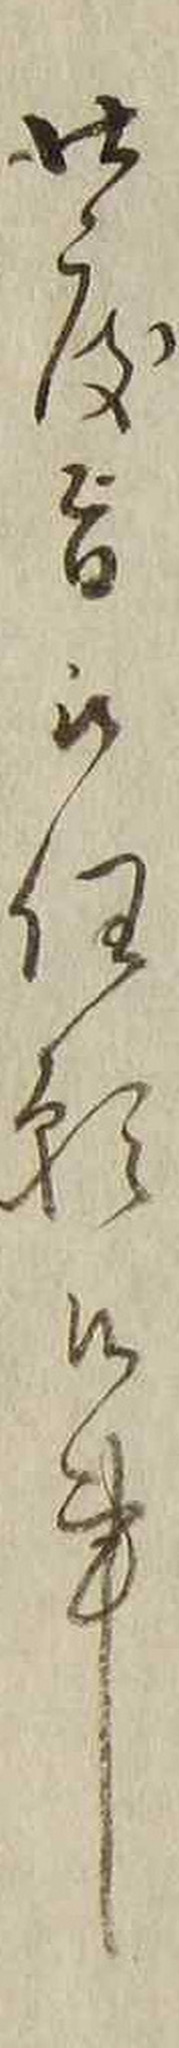仕度旨被任願候事
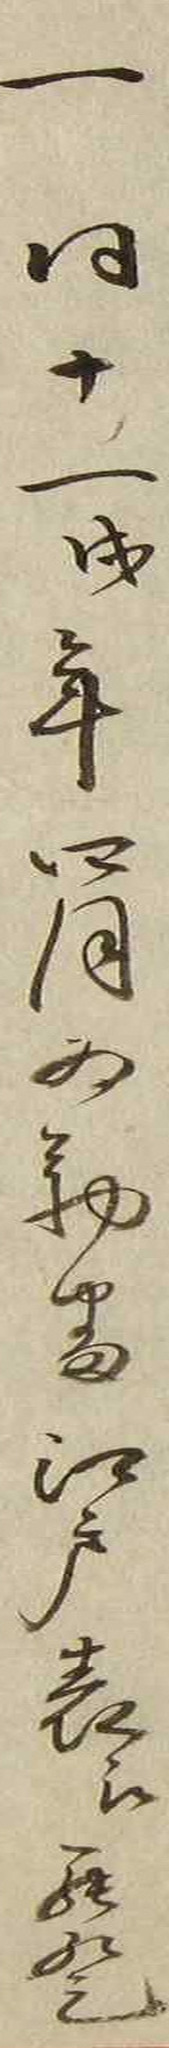一同十一戌年四月為勤番江戸表江罷登

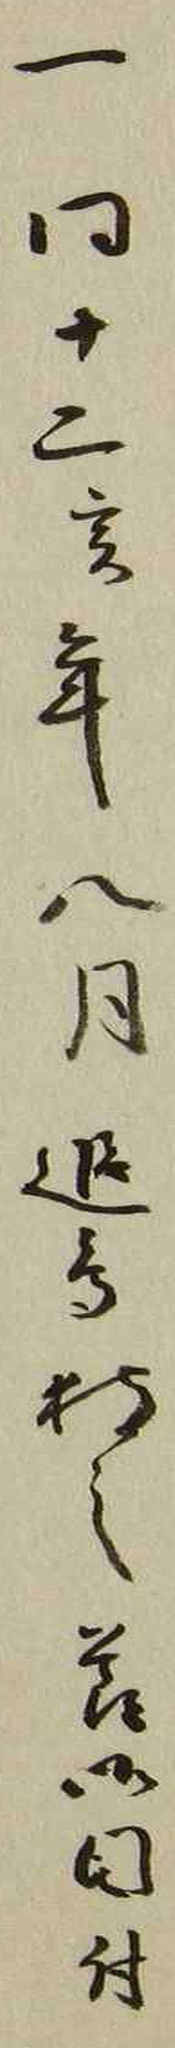一同十二亥年八月追鳥狩之節御目付
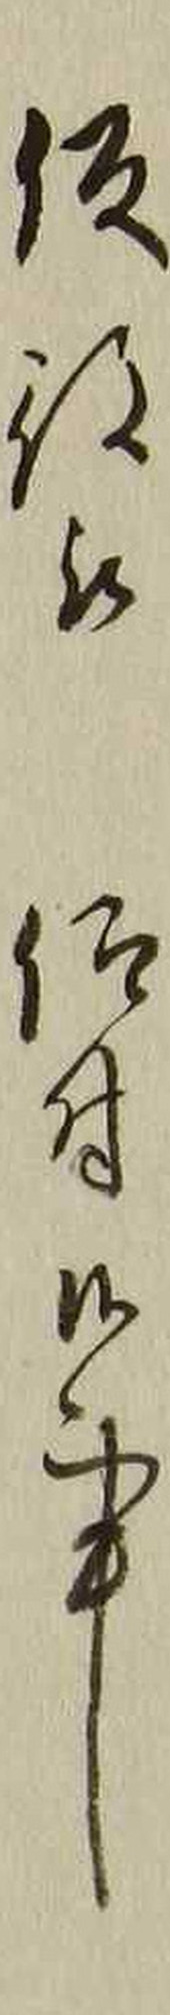仮役被仰付候事
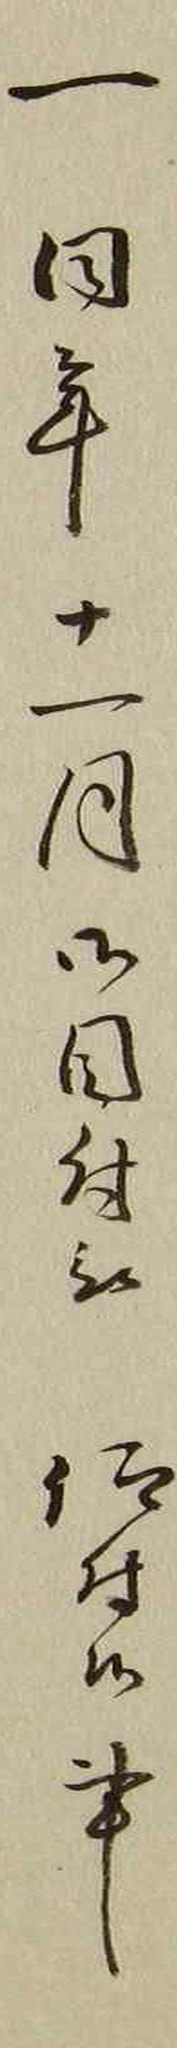一同年十一月御目付被仰付候事
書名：諸士系譜　巻之3　い之部3
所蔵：会津若松市立会津図書館
